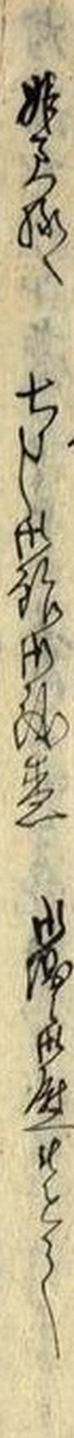姫君様へちらし御鮓御鉢盛御側御慰被進之
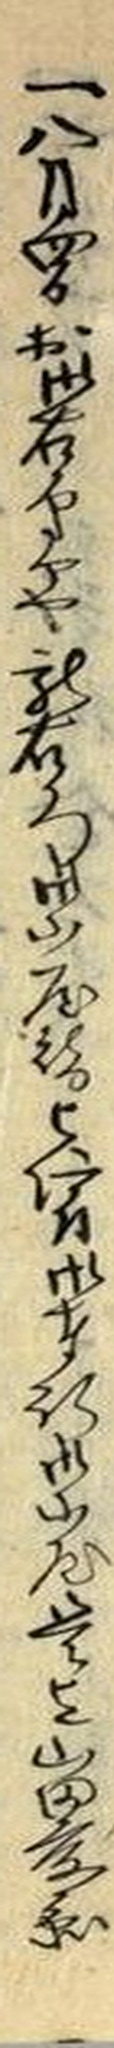一八月四日於御右筆部や新右衛門御小屋替被仰付御奉行御小屋是迄山田藤兵衛
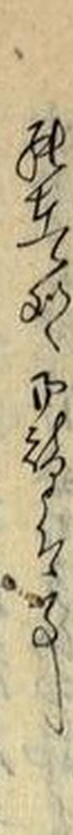罷在候処へ御替被下候事
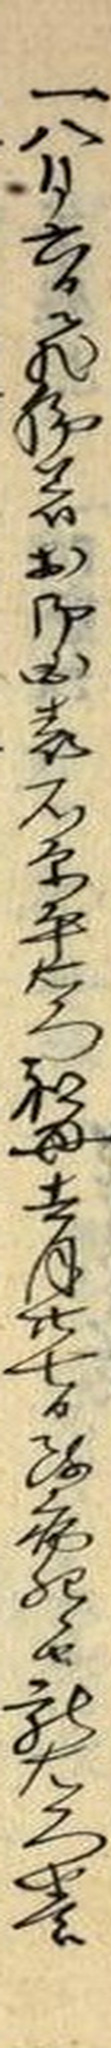一八月六日飛脚着於御国表石原平右衛門祖母去月廿七日致病死候由新右衛門養
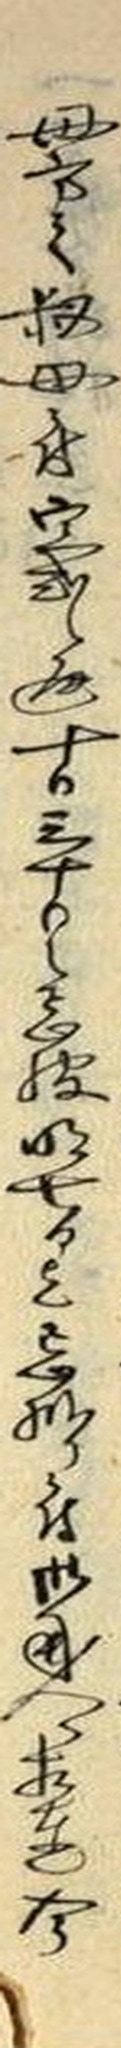母方之叔母ニ付定式之通十日三十日之忌服明七日迄忌掛りニ付御用人へ相達今
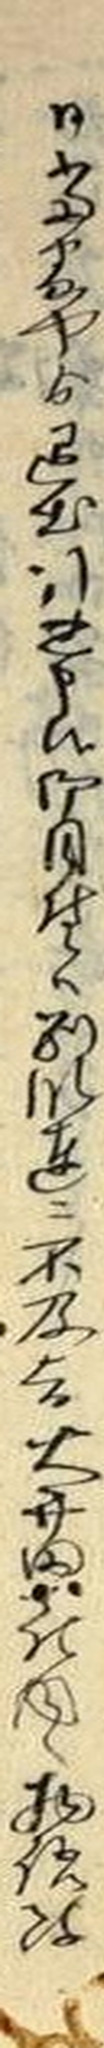日当番中ゟ退出引込申候御目付へハ別段達ニ不及旨大井田喜内へ物語致
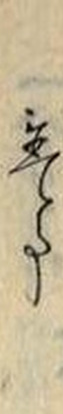置候事
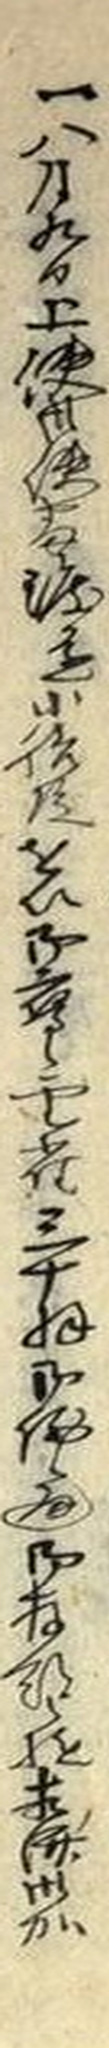一八月九日上使御使番渡辺小膳殿を以御鷹之雲雀三十羽御例之通御拝領被遊相済御加
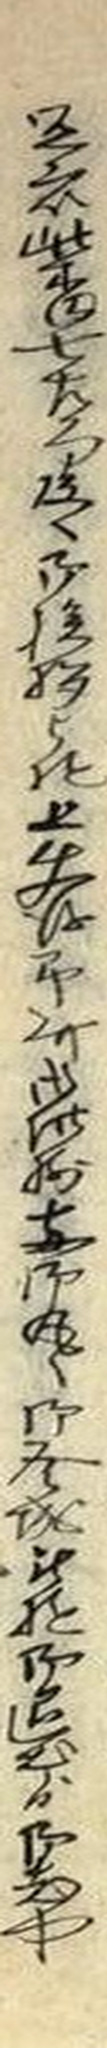番衆柴田七左衛門殿へ御挨拶被遊上使後即刻御供両御丸へ御登城被遊御退出ゟ御老中
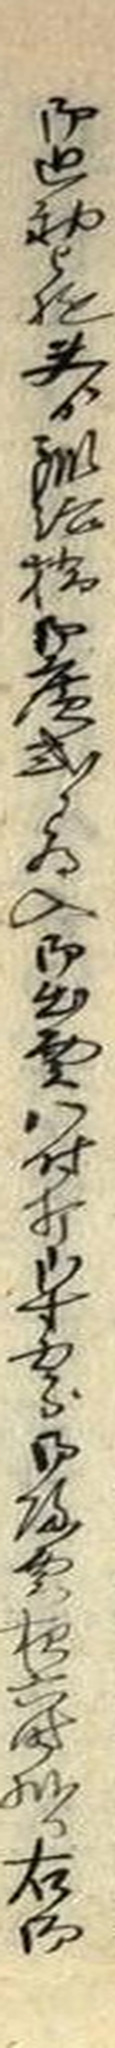御廻勤被遊夫ゟ鍛冶橋御広式被為入御出殿八時打弐寸五分御帰殿夜六時掛り右御
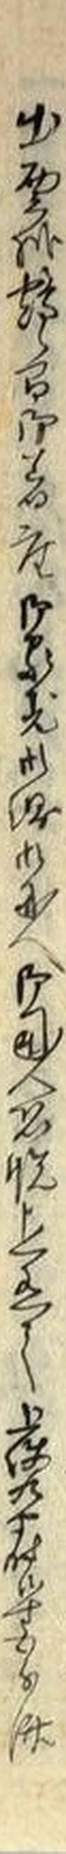出殿掛鶴之間御着座御家老御側御用人御用人恐悦申上有之上使九半時弐寸五分済
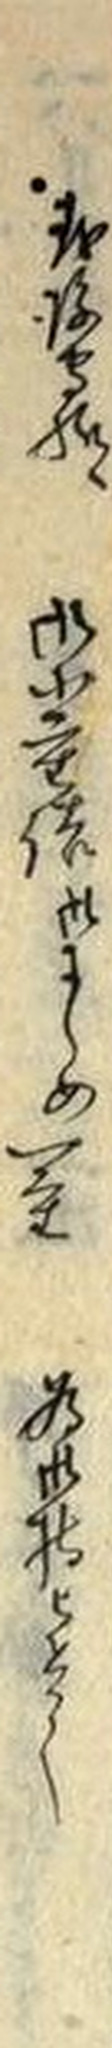越後守殿へ御小重詰御にしめ一重為御持被進之

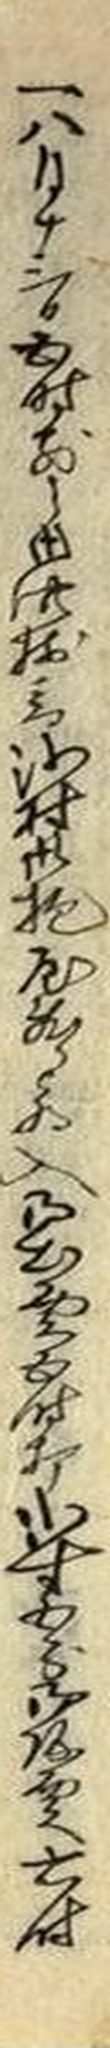一八月十三日五時前之御供揃ニ而砂村御抱屋敷被為入御出殿五時打弐寸五分御帰殿六時
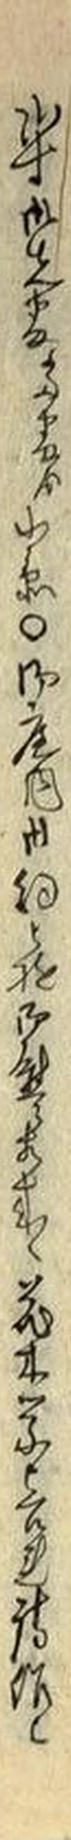弐寸御先番当番ゟ小兵衛○御庭内御釣被遊御慰ニ相成候花木栄被召連詩作被
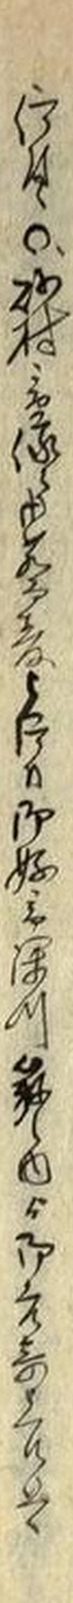仰付候○砂村ニ而俄ニ御蕎麦被仰付御好ニ而深川藪之内ゟ御取寄被召上候
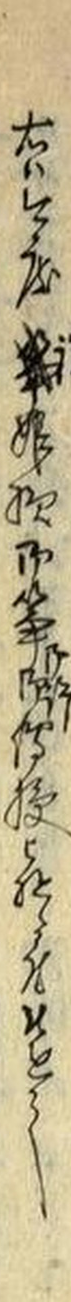右ハ今度謹姫様御箏御御伝授被遊候付被進之
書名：少傅日録抄（斉承付側向頭取日記、在府）
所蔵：福井県文書館 Fukui Prefectural Archives
